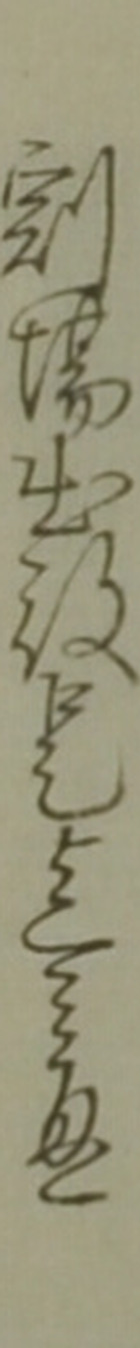割場出役是迄之通
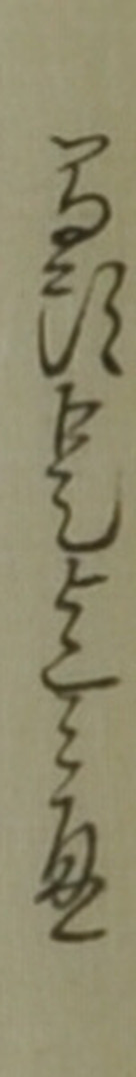間頭是迄之通
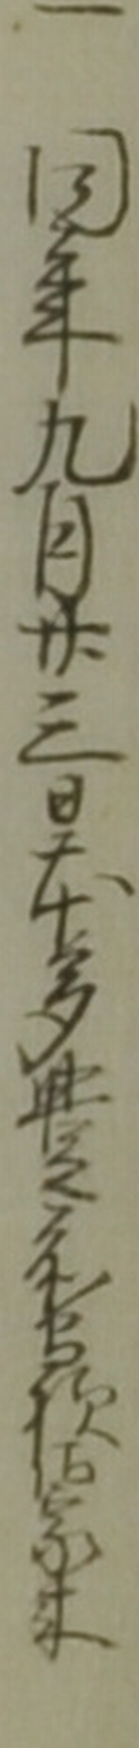一同年九月廿三日本多豊前守様御家来
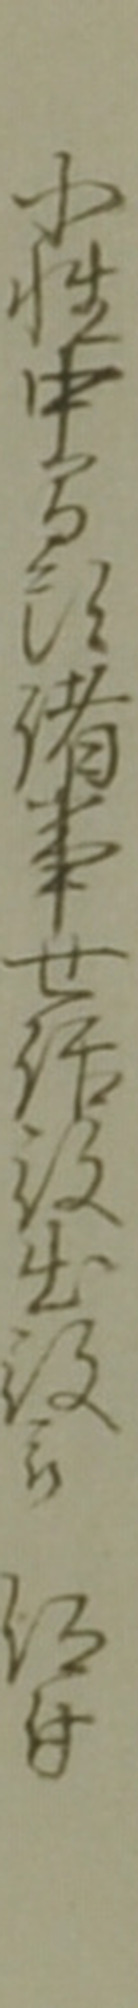小性中間頭諸事世話役出役被仰付
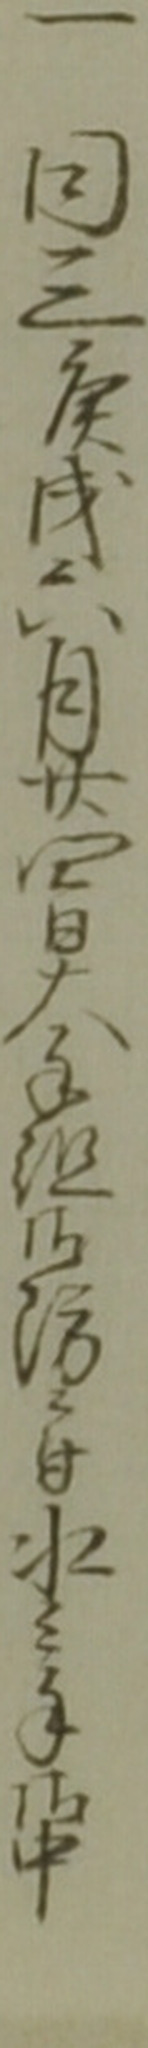一同三庚戌六月廿四日大手組御防ニ付水之手御中
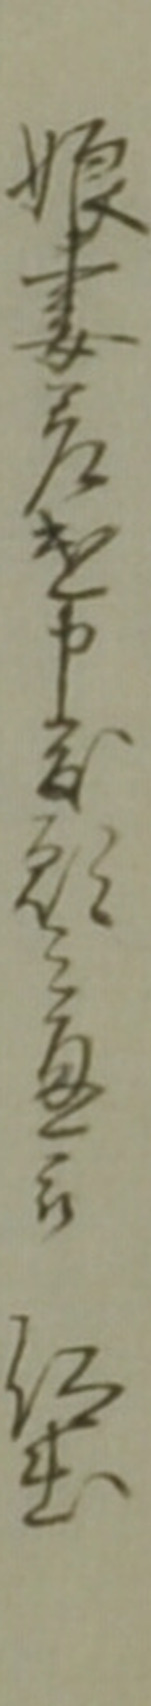娘妻差遣申度願之通被仰出
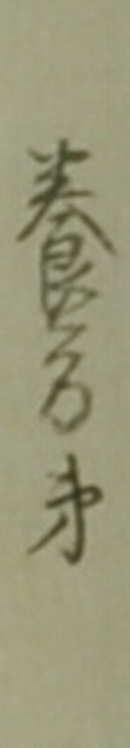養方弟
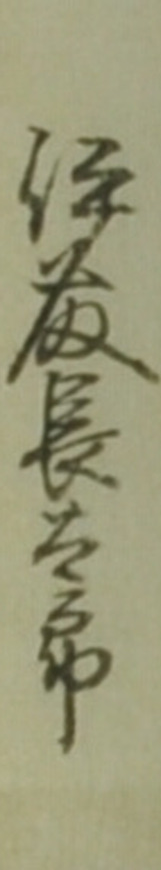伊藤長太郎

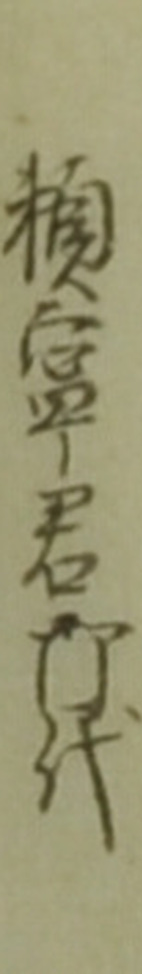頼寧君御代
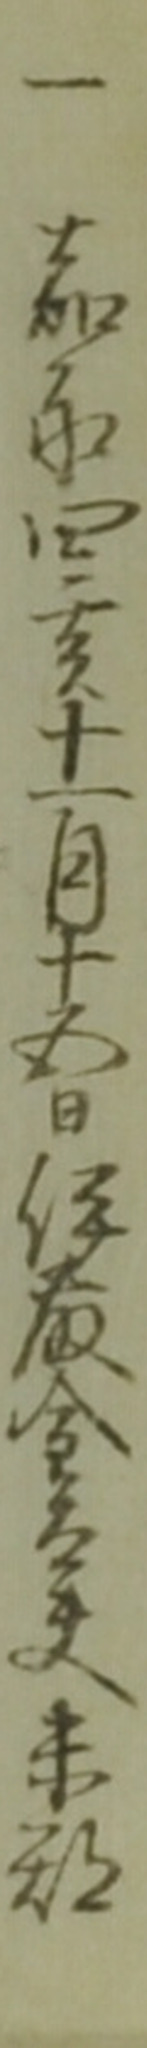一嘉永四亥十一月十五日伊藤金太夫末期
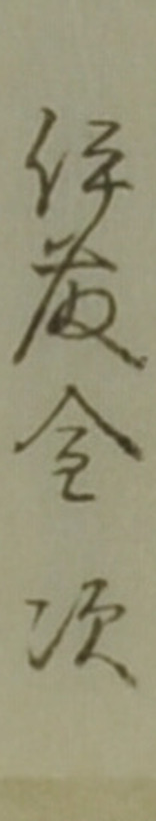伊藤金次

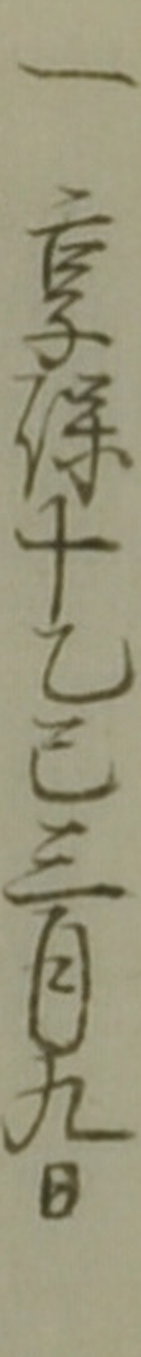一享保十己巳三月九日
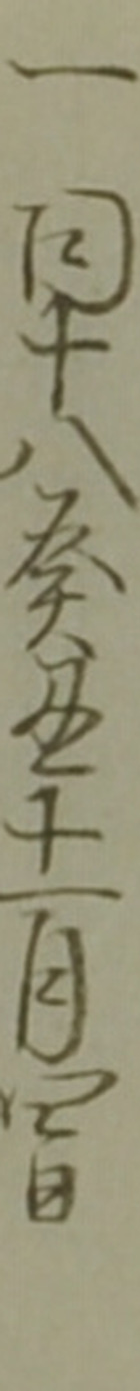一同十八癸丑十一月四日
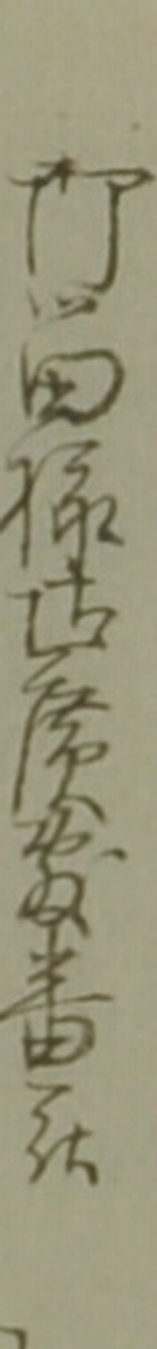御留様御広敷番被仰付
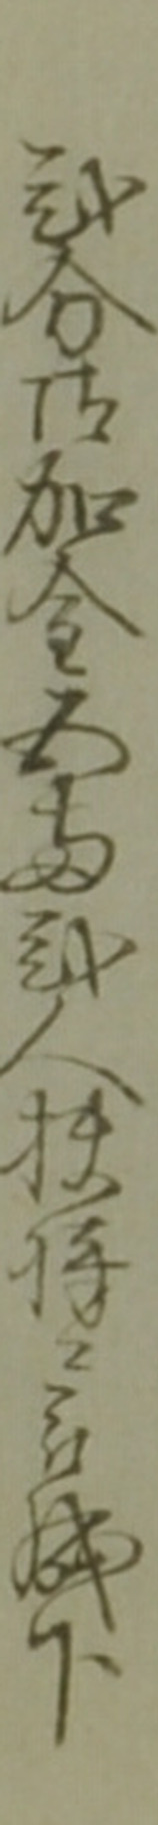弐分御加金五両弐人扶持ニ被成下
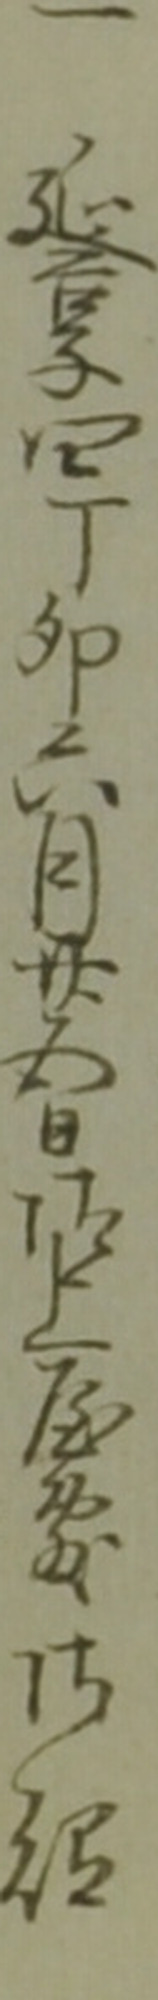一延享四丁卯六月廿五日御上屋敷御賄
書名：無足諸士勤仕録（一）
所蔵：伊那市立高遠町図書館・合同会社AMANE
